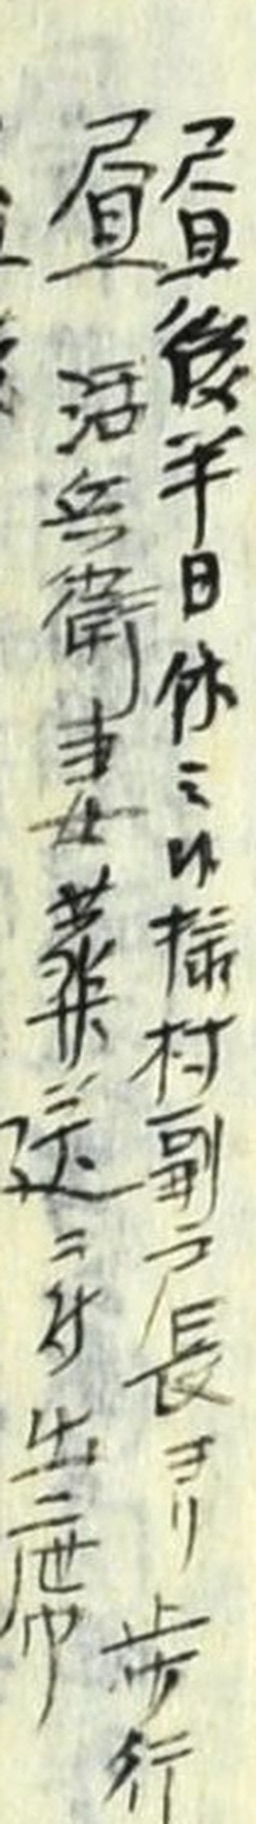昼治兵衛妻葬送ニ付出席
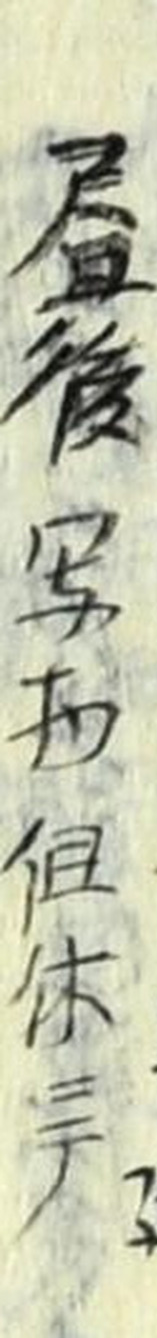昼後写物但休ニテ
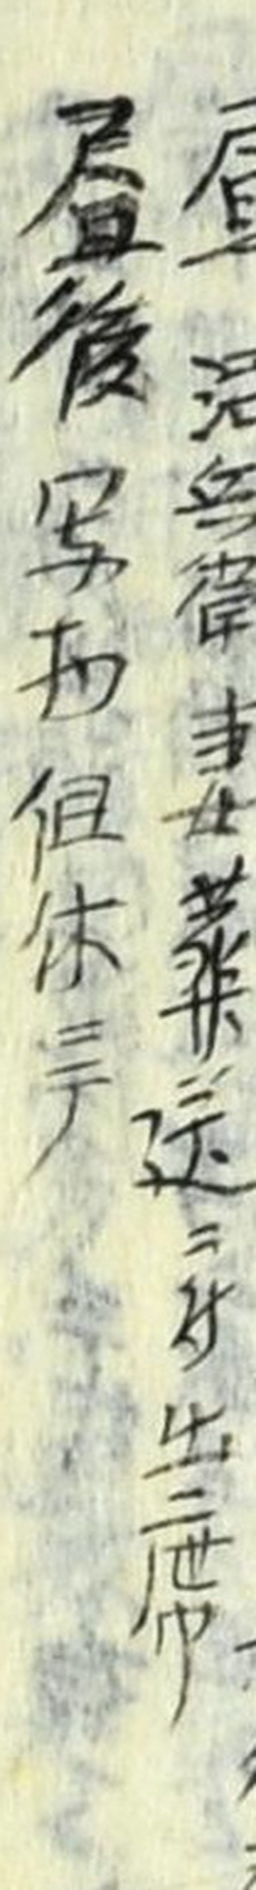昼後写物但休ニテ
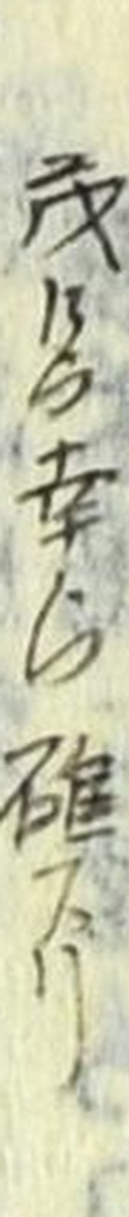茂左衛門幸右衛門碓スリ
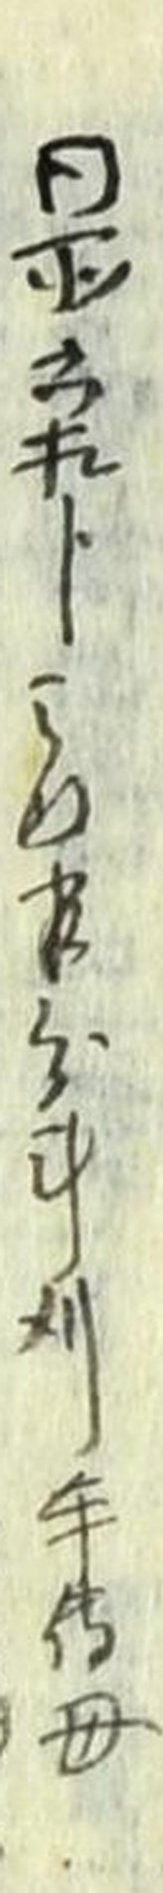同所六拾歩之内半分計刈手伝母
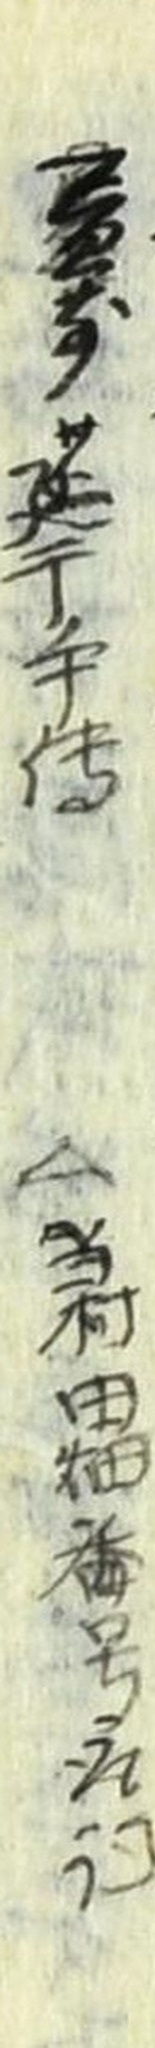昼前莚干手伝△当村田畑番号取調
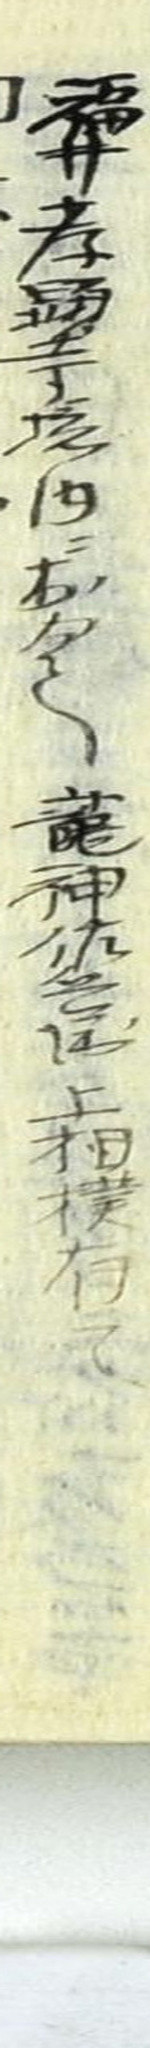福井孝顕寺境内ニおゐて籠神佐兵衛上相撲有之
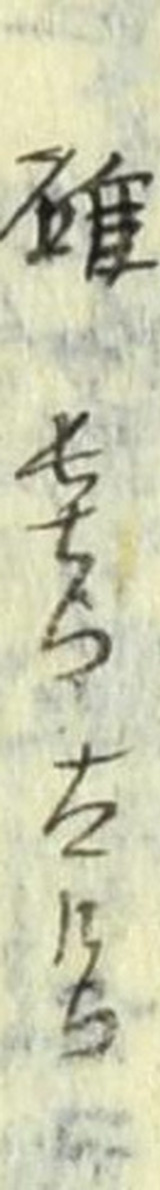碓長右衛門太左衛門
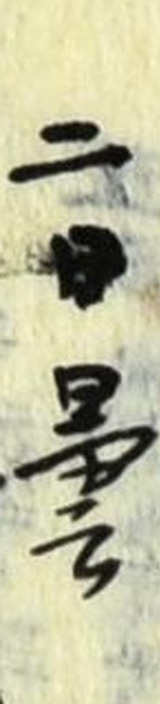二日曇同
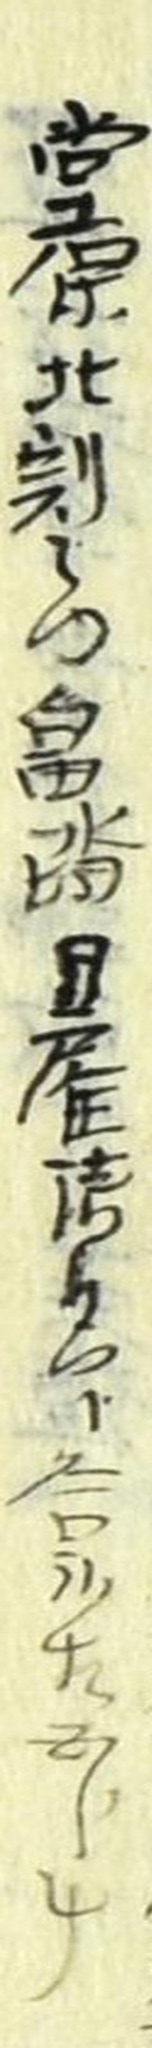堂保北割之内畠踏日雇清左衛門ト合弐拾五歩計

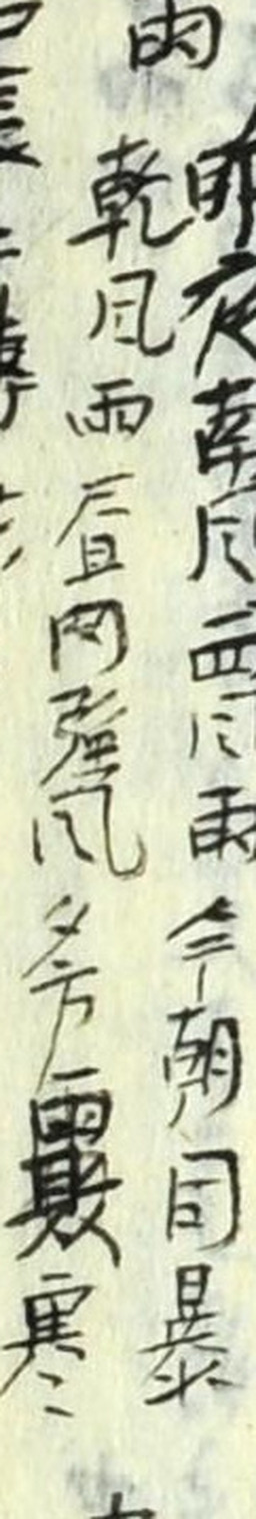乾風雨昼同強風夕方霰寒
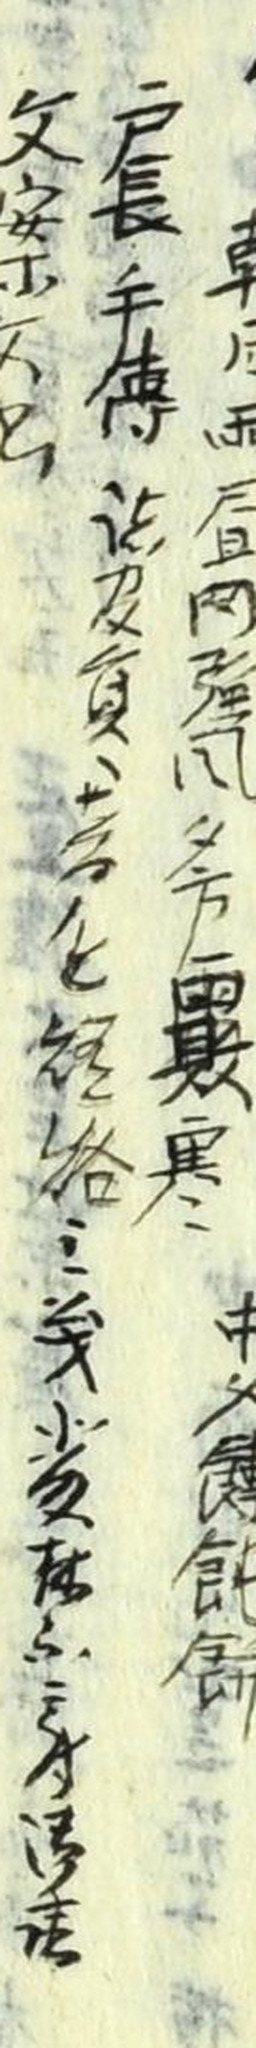戸長手伝諸官員へ寄進賄賂之義厳禁ニ付御請
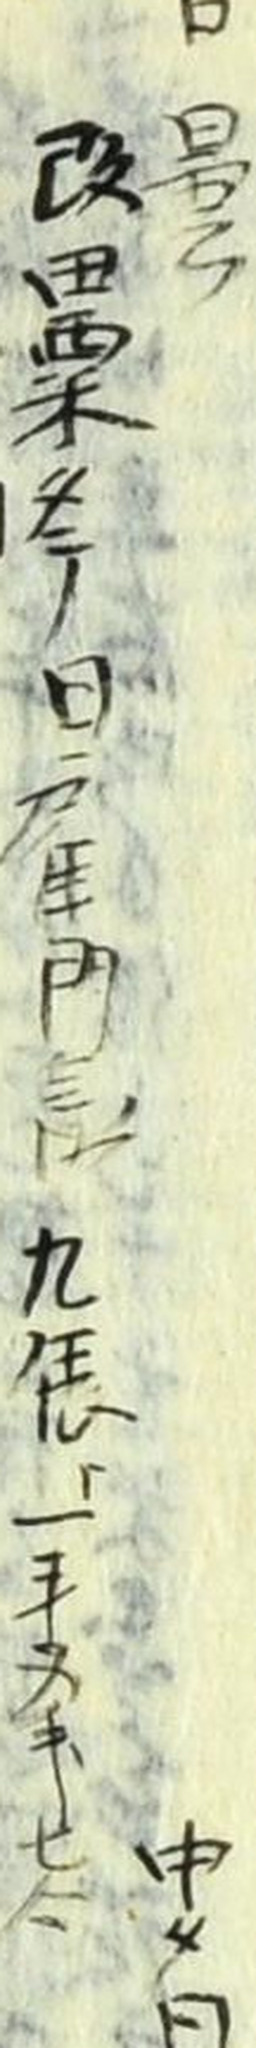改田粟タテ日雇門兵衛九俵ト一斗五升七合
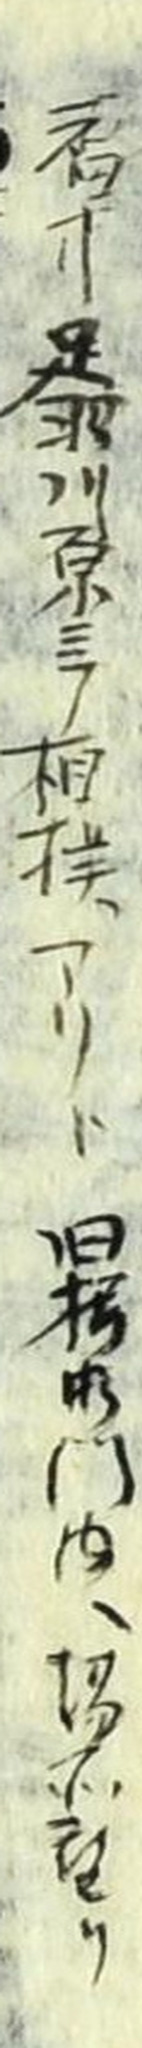福井足羽川原ニテ相撲アリト旧桜御門へ場所替リ
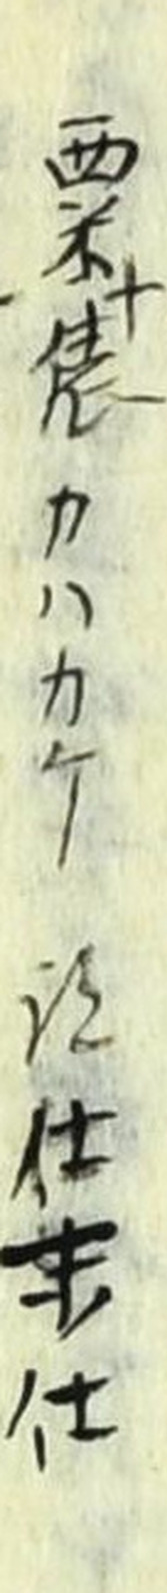粟十俵カハカケ諸仕末仕
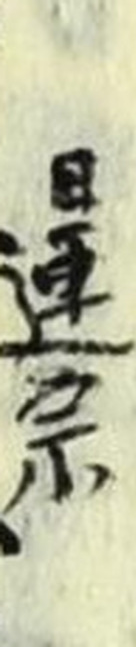日連宗
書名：（日記）
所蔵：福井県文書館 Fukui Prefectural Archives
